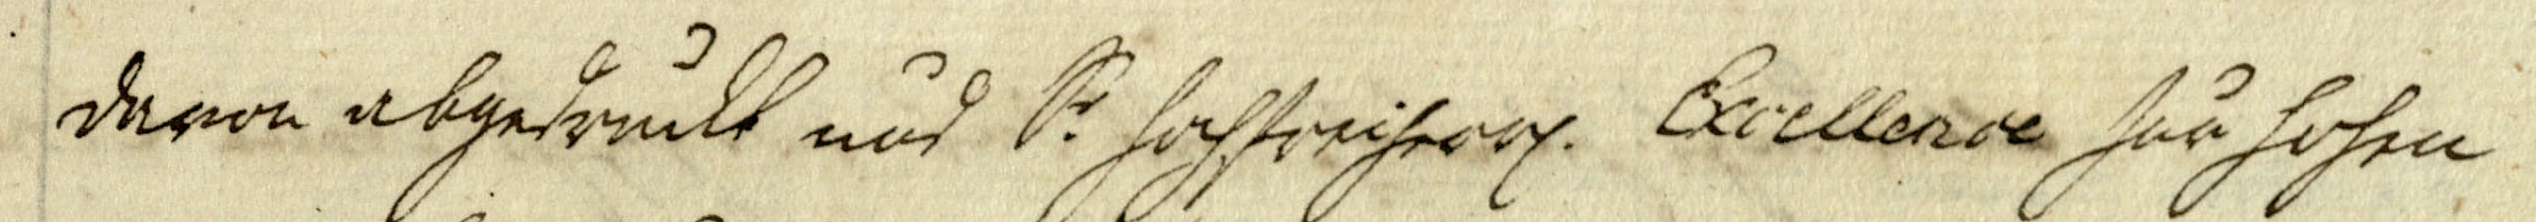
davon abgedruckt und Sr. hochfreiherrl. Excellence zur hohen
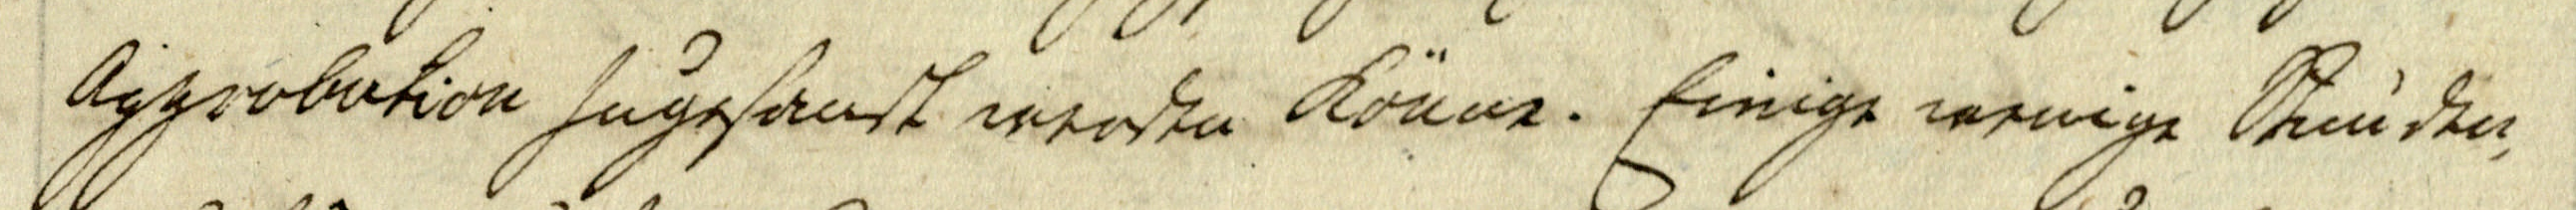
Approbation zugesandt werden könne. Einige wenige Stunden,
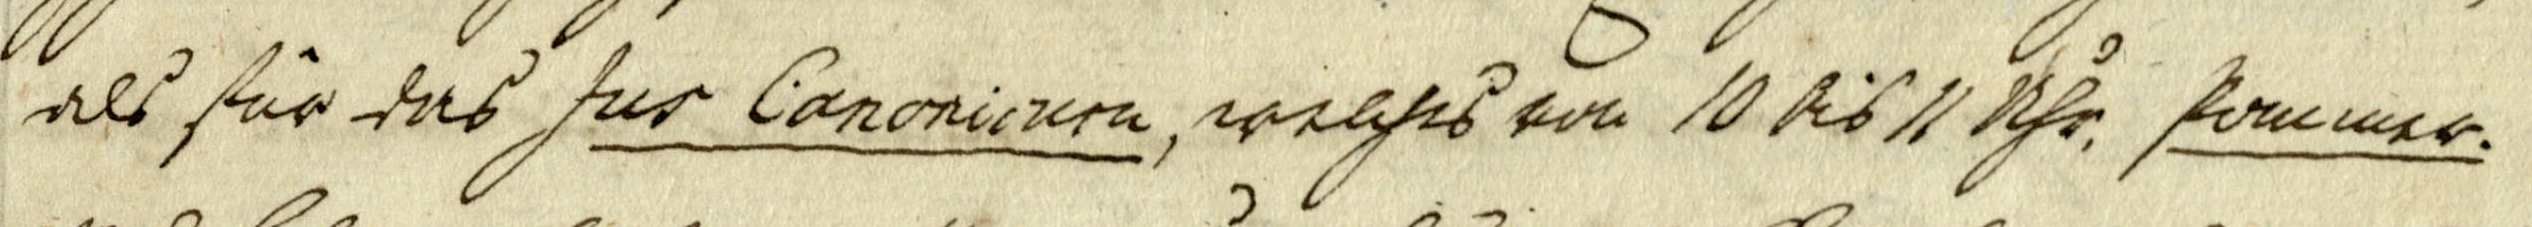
als für das Jus Canonicum, welches von 10 bis 11 Uhr, Pommer¬
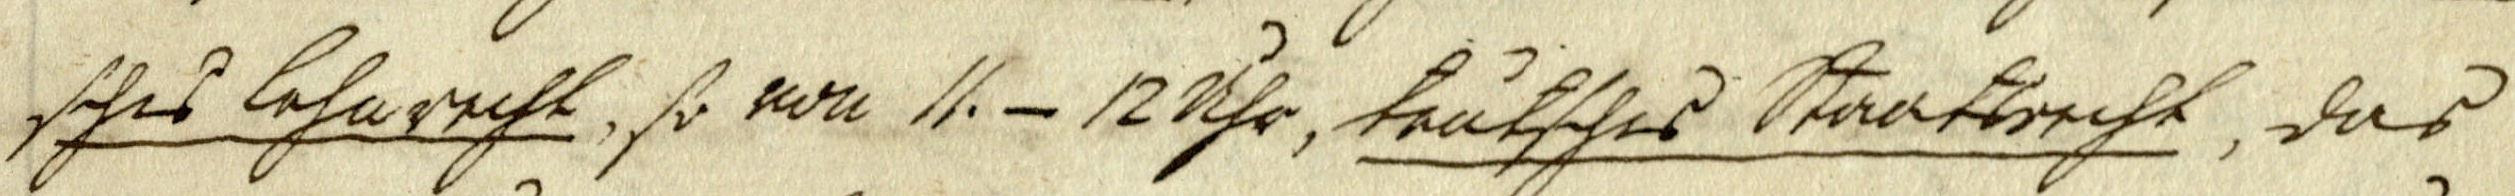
sches Lehnrecht, so von 11.-12 Uhr, teutsches Staatsrecht, das
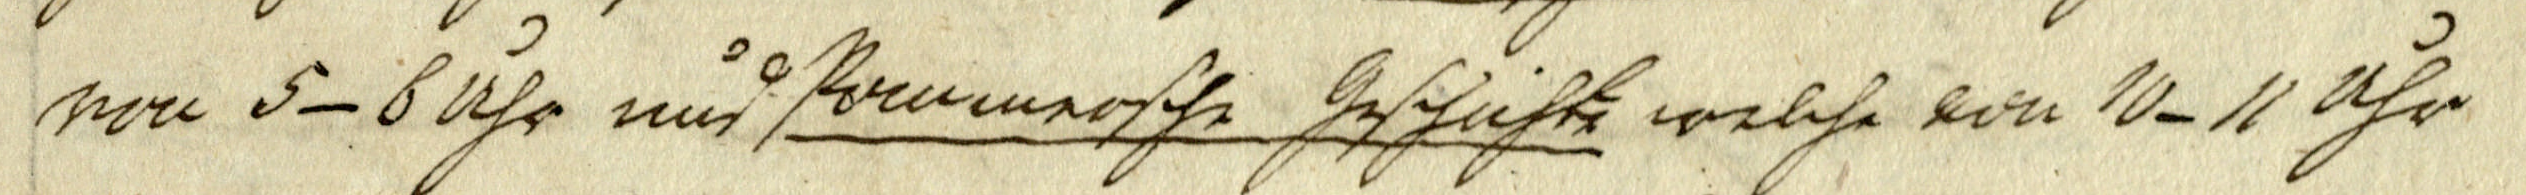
von 5-6 Uhr und Pommersche Geschichte welche von 10-11 Uhr
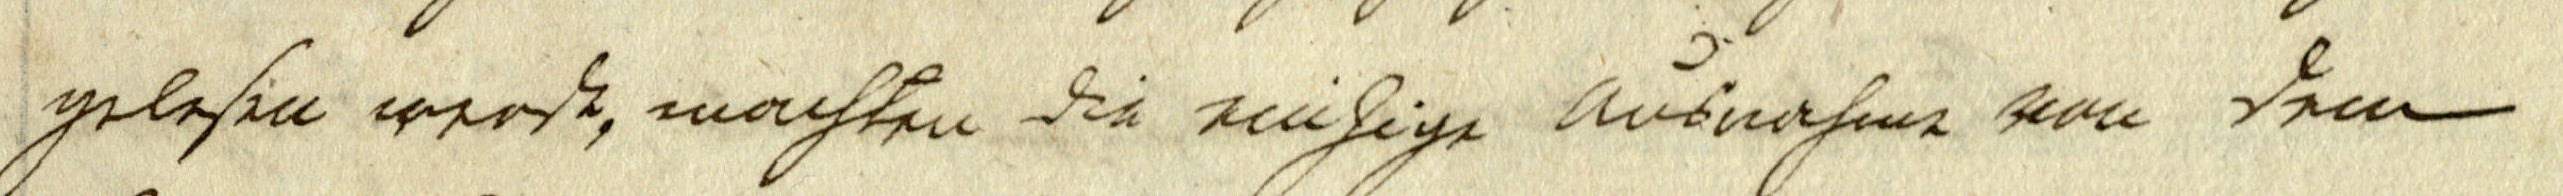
gelesen werde, machten die einzige Ausnahme von dem
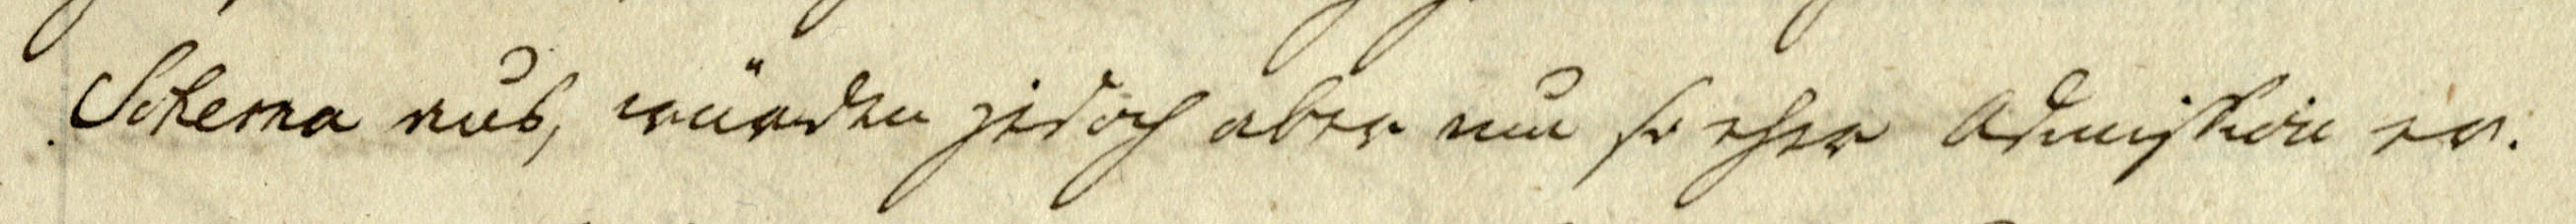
Schema aus, würden jedoch aber um so eher Admission er¬
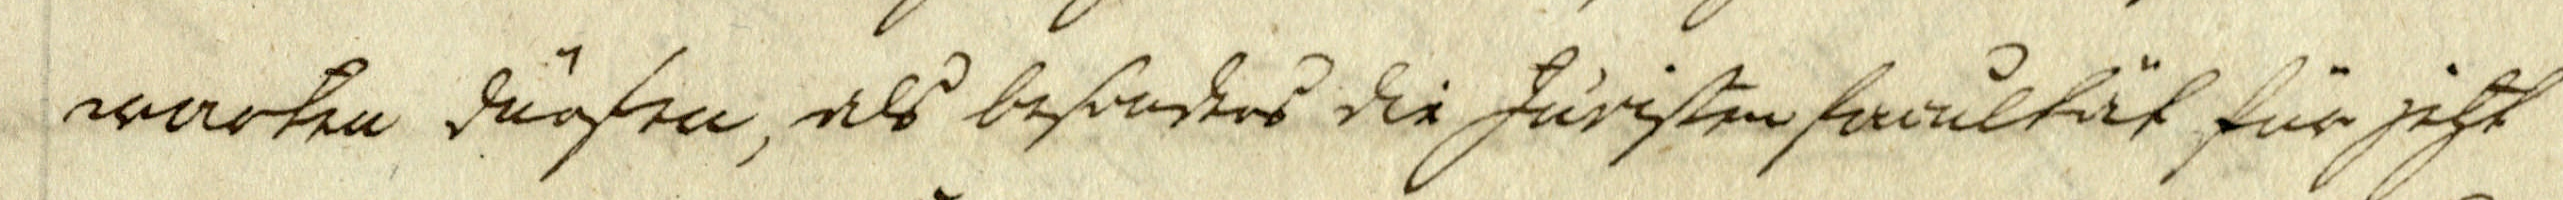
warten dürfen, als besonders die Juristenfacultät für jetzt
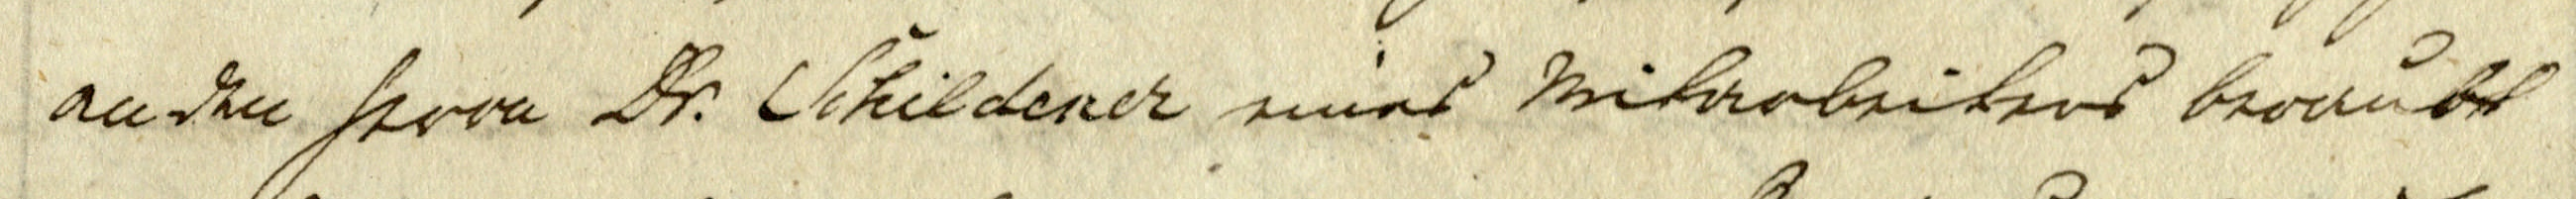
an den herrn Dr. Schildener eines Mitarbeiters beraubet
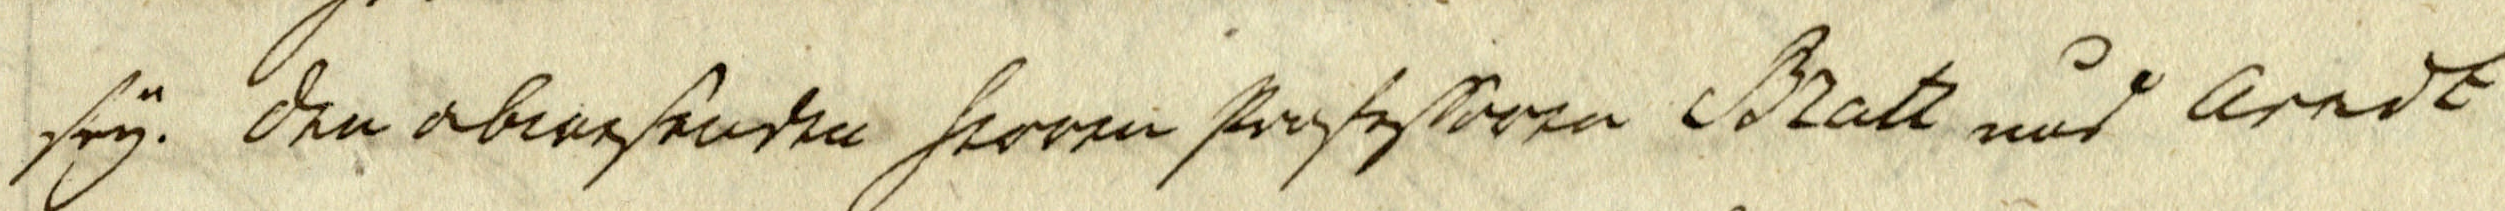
seÿ. Den abwesenden Herren Professoren Bratt und Arndt
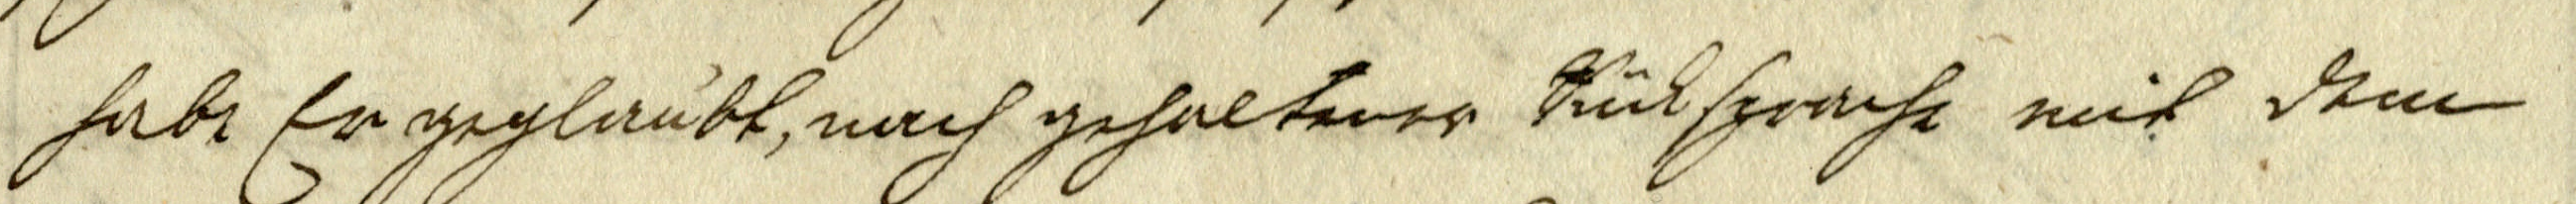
habe Er geglaubt, nach gehaltener Rücksprache mit dem
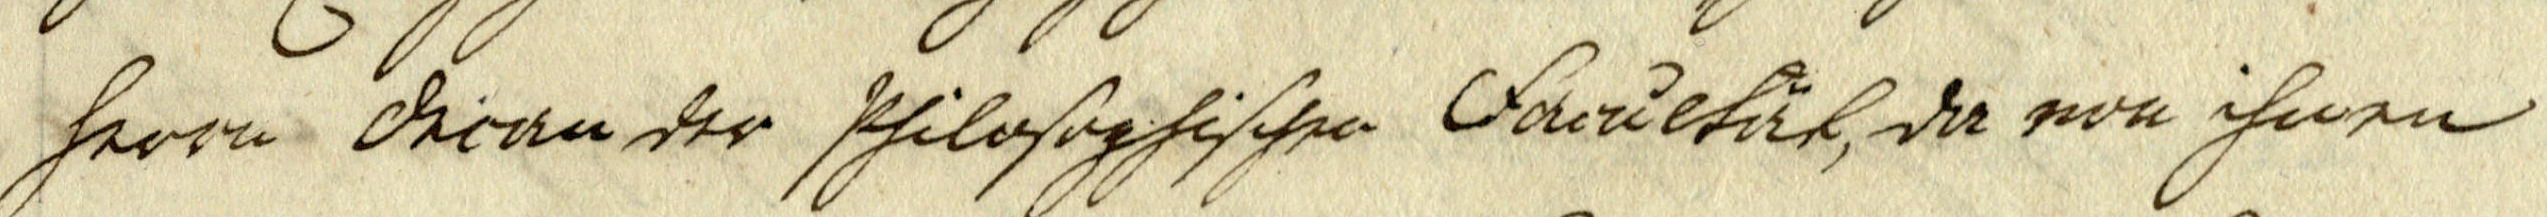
herrn Decan der Philosophischen Facultät, da von ihnen
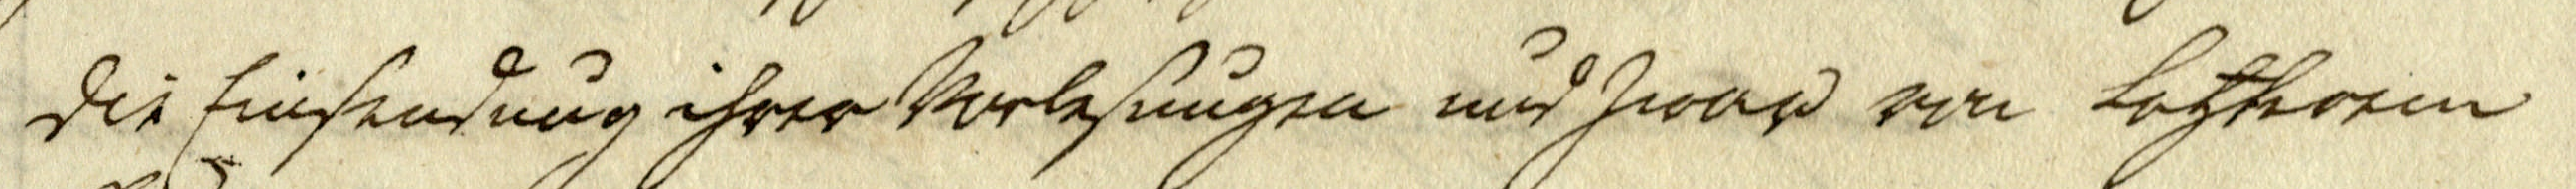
die Einsendung ihrer Vorlesungen und zwar von letzterem
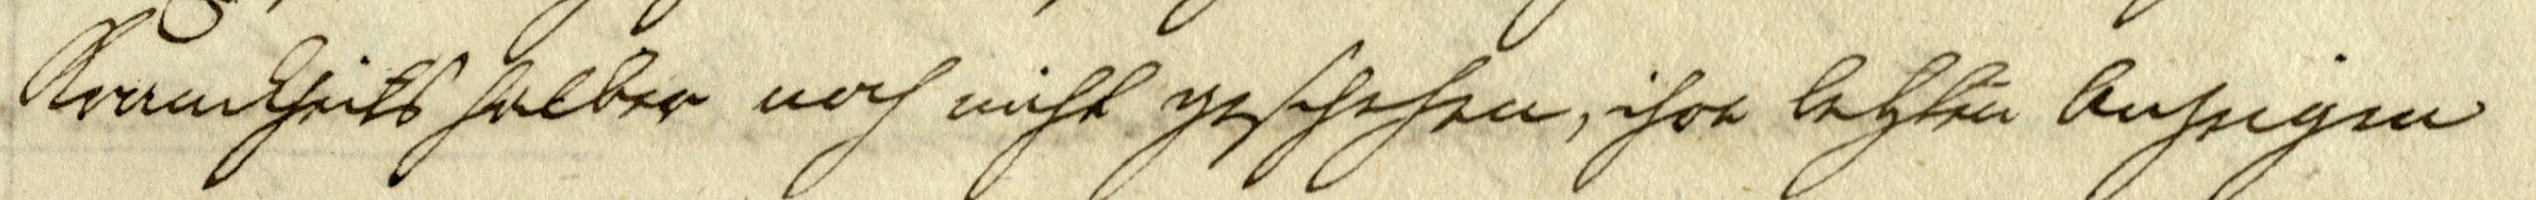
Krankheitshalber noch nicht geschehen, ihre letzten Anzeigen
